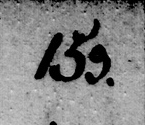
ts¬
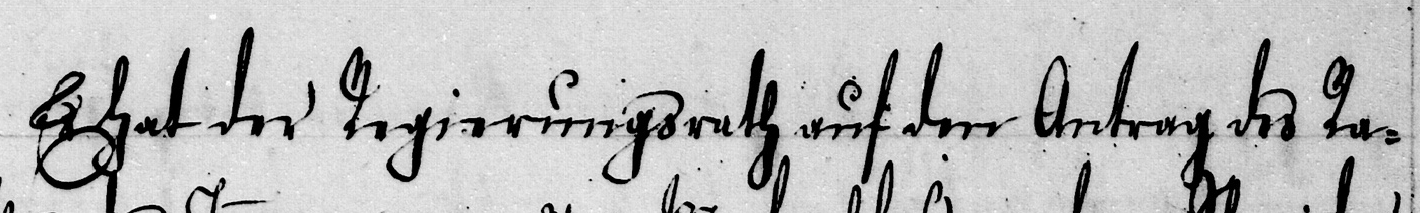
Es hat der Regierungsrath auf den Antrag des Ra¬
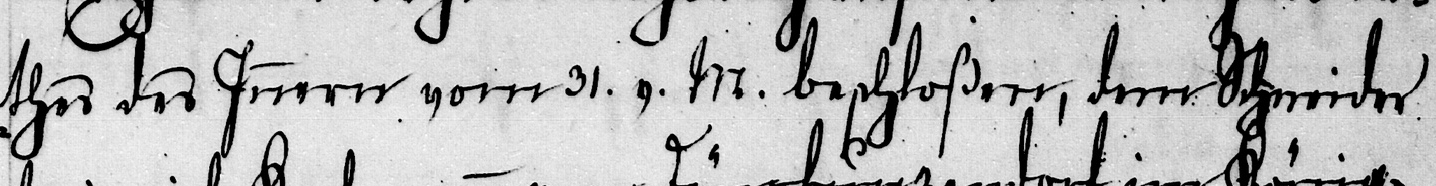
thes des Innern vom 31. v. M. beschloßen, dem Schneider
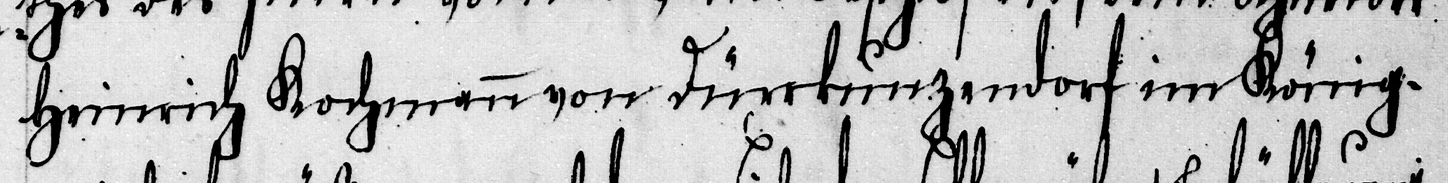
Heinrich Kochmann von Dürrkunzendorf im König¬
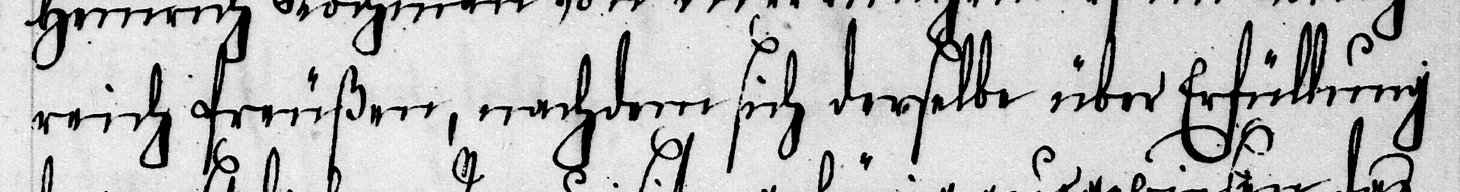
reich Preußen, nachdem sich derselbe über Erfüllung
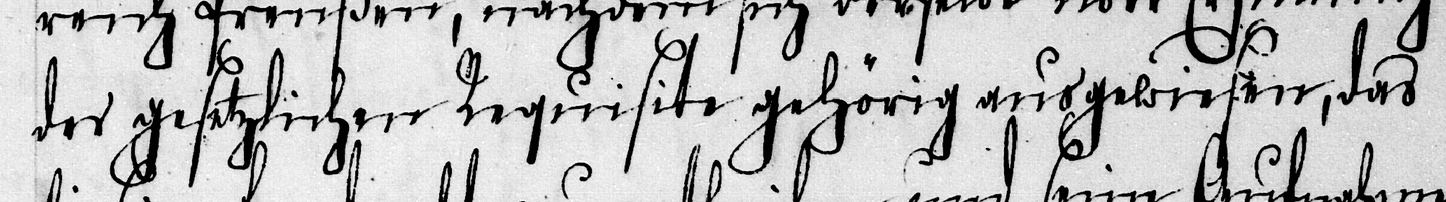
der gesetzlichen Requisite gehörig ausgewiesen, das
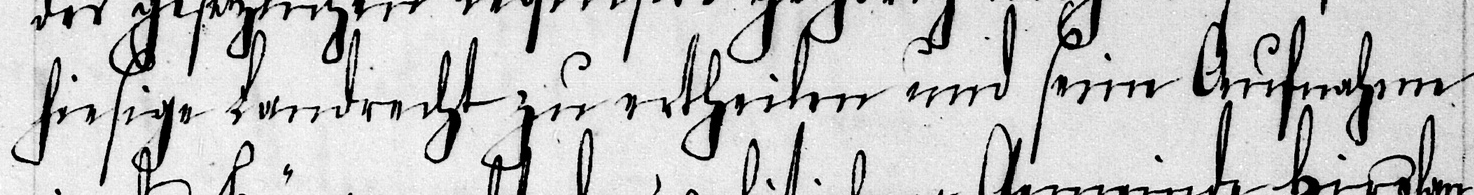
hiesige Landrecht zu ertheilen und seine Aufnahme
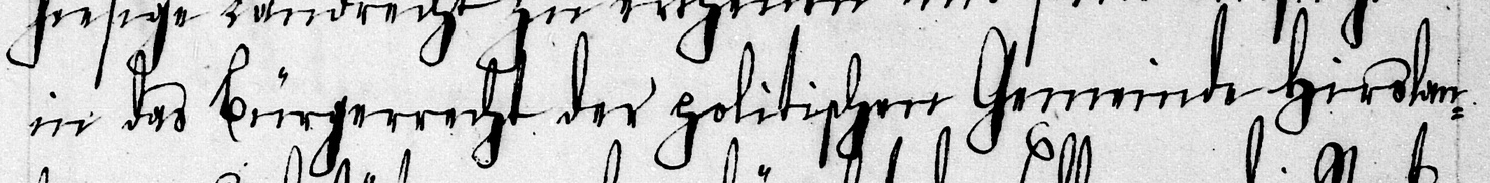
in das Bürgerrecht der politischen Gemeinde Hirslan¬
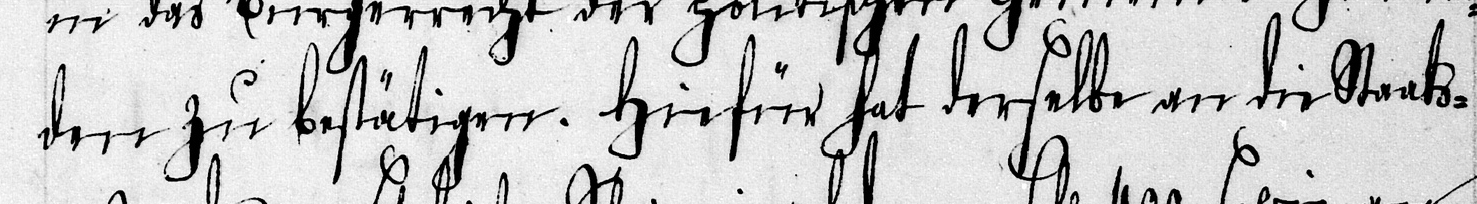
den zu bestätigen. Hiefür hat derselbe an die Staa¬
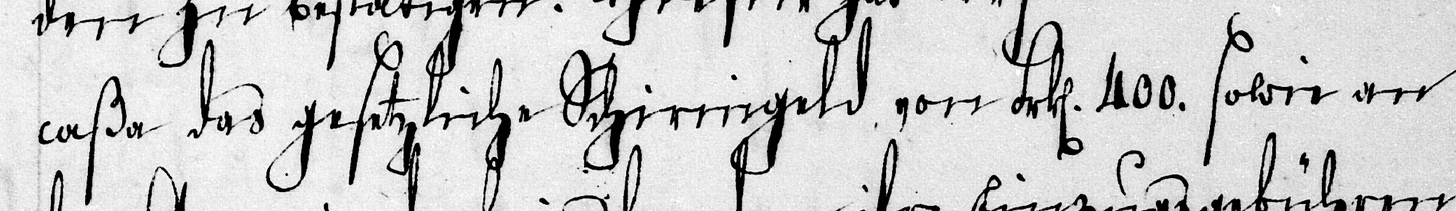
caßa das gesetzliche Schirmgeld von Frk[en]. 400. sowie an
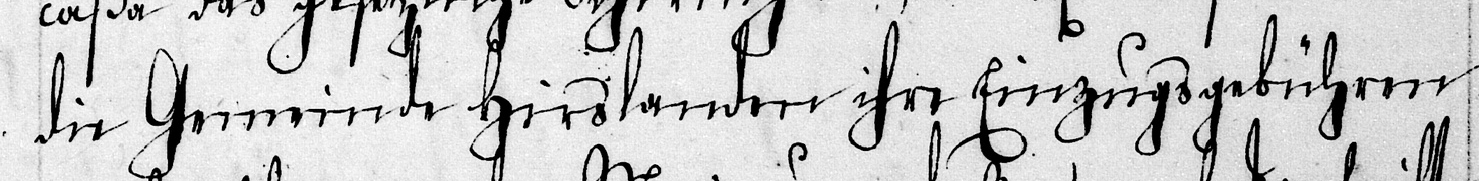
die Gemeinde Hirslanden ihre Einzugsgebühren
